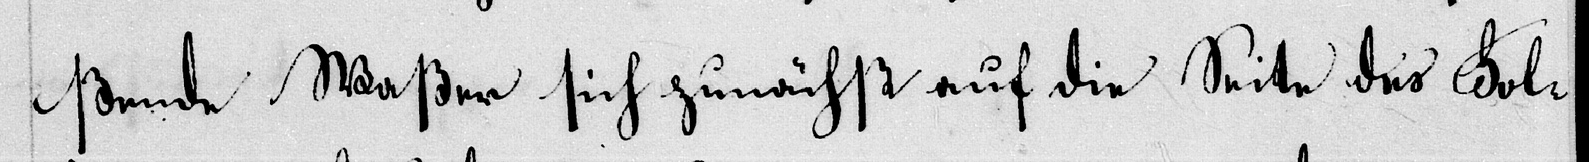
ßende Waßer sich zunächst auf die Seite des Fol¬
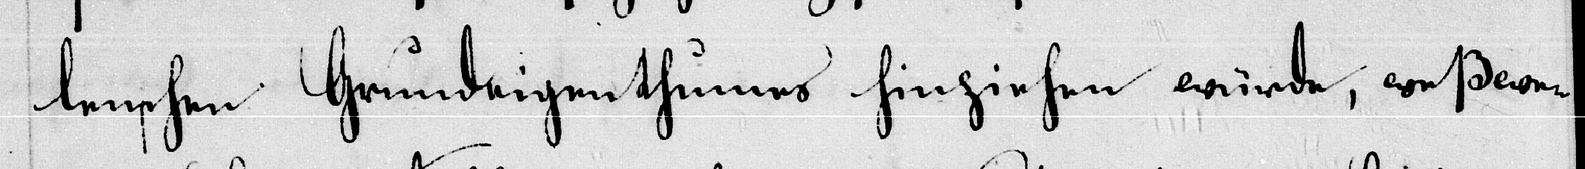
lenschen Grundeigenthumes hinziehen würde, weßwe¬
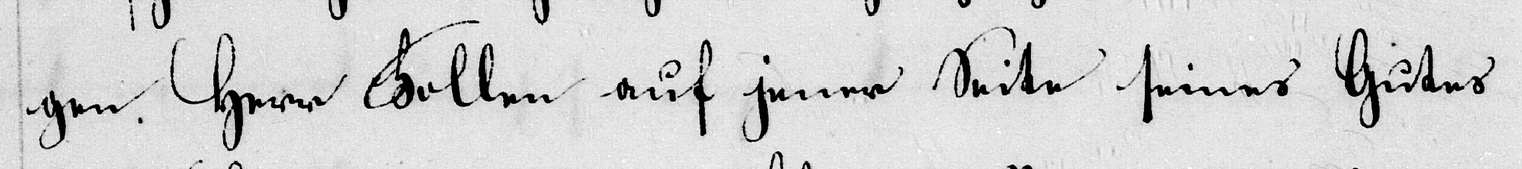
gen Herr Follen auf jener Seite seines Gutes
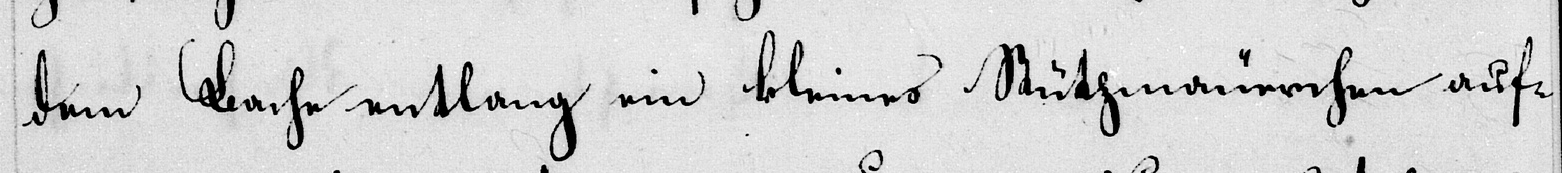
dem Bache entlang ein kleines Stützmäuerchen auf¬
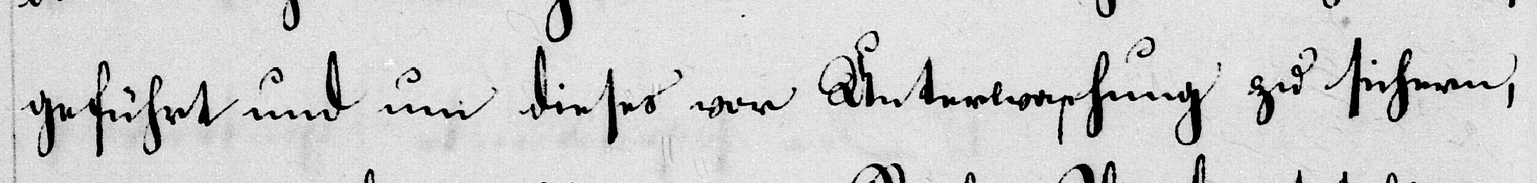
geführt und um dieses vor Unterwaschung zu sichern,
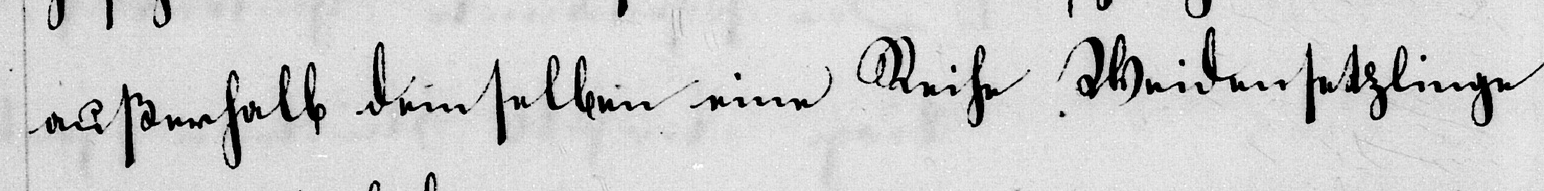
außerhalb demselben eine Reihe Weidensetzlinge
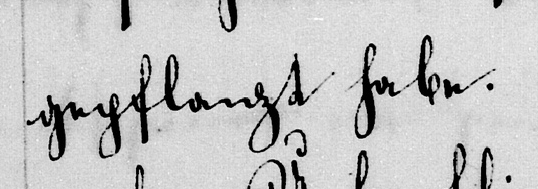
gepflanzt habe.
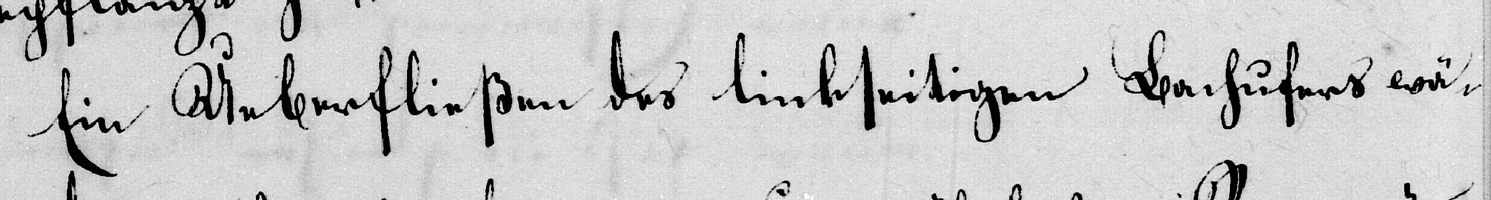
Ein Ueberfließen des linkseitigen Bachufers wä¬
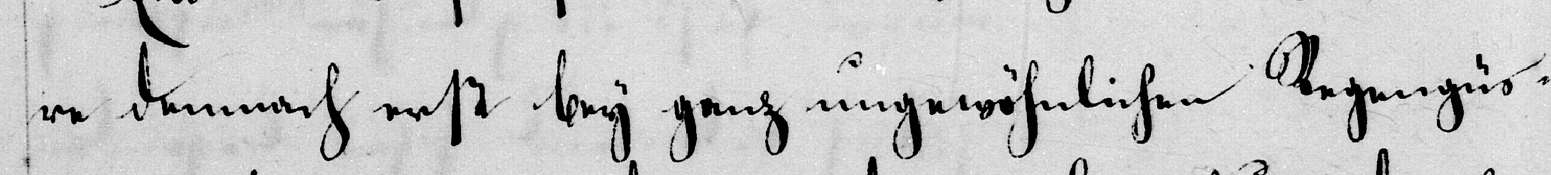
re demnach erst bey ganz ungewöhnlichen Regengü¬
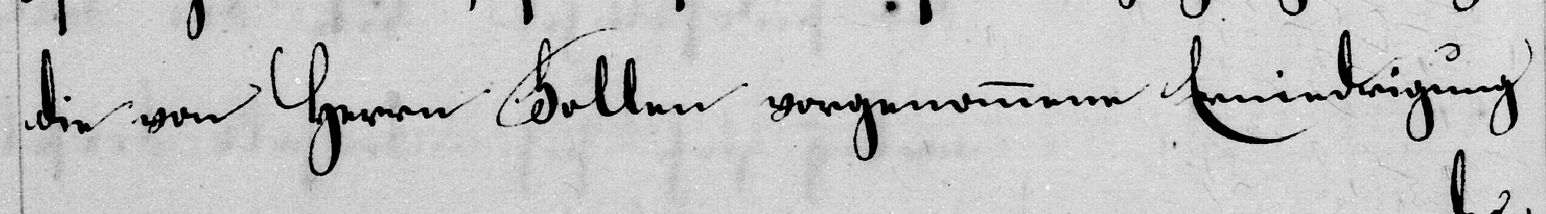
die von Herrn Follen vorgenommenen Erniedrigung
